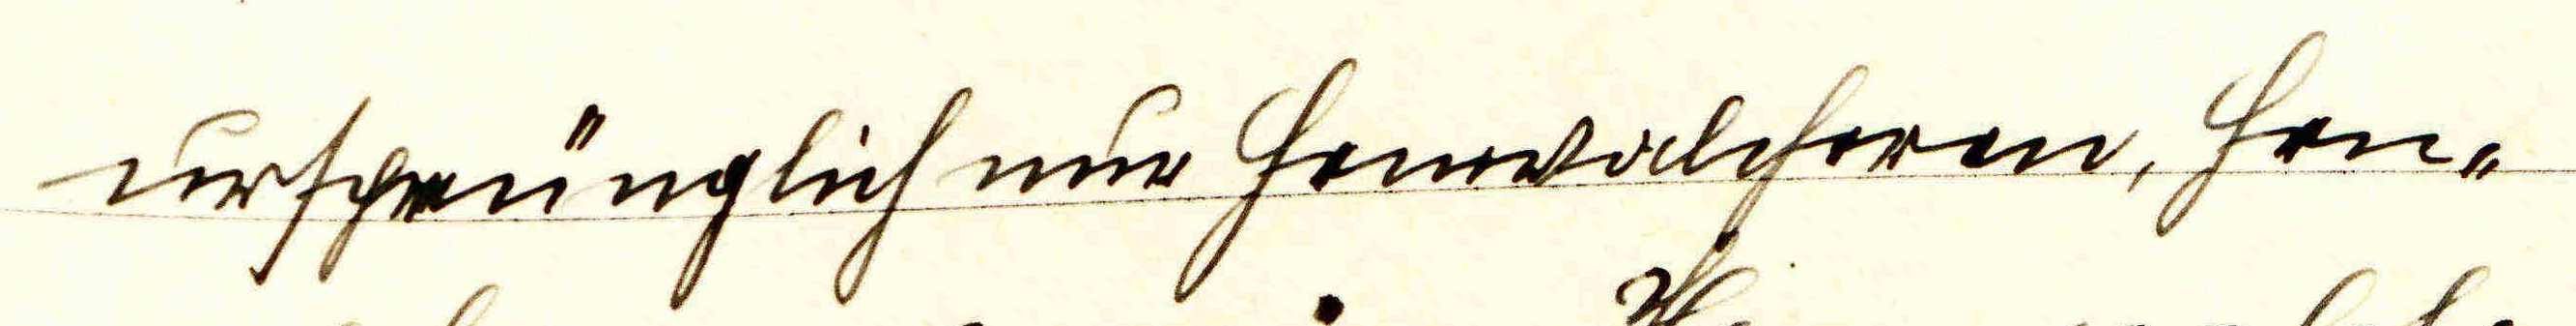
ursprünglich nur Henwalcheren, Hen-
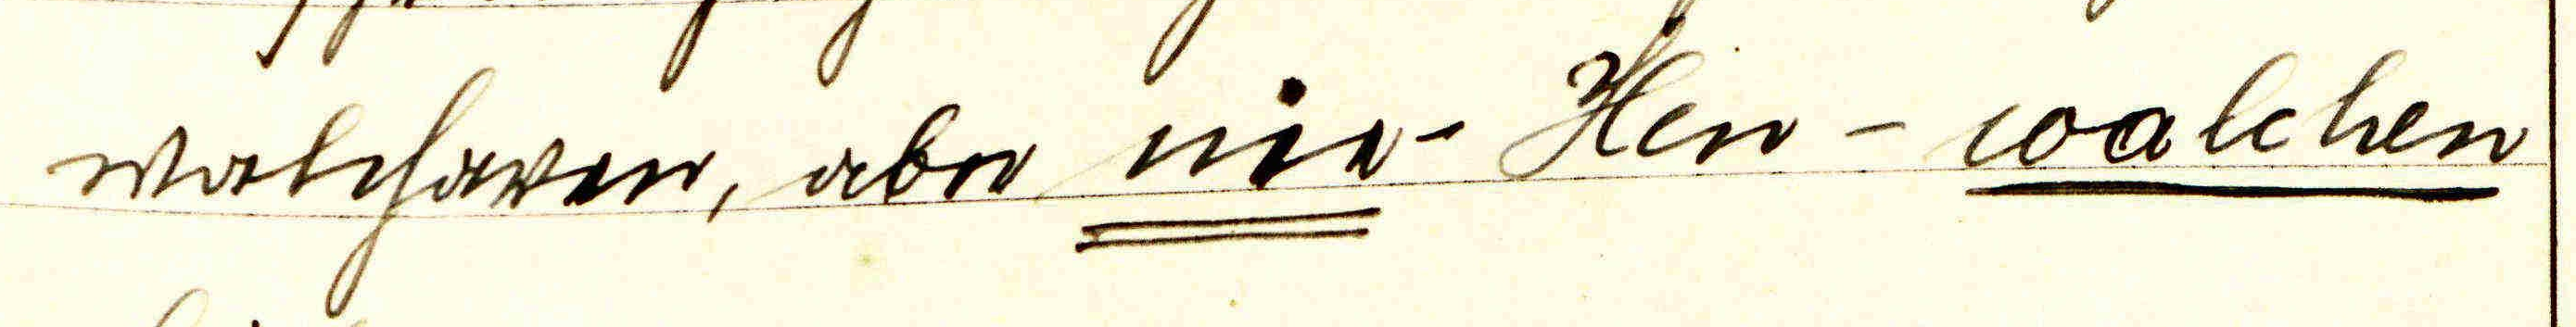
walcharen, aber nie Hen-walchen
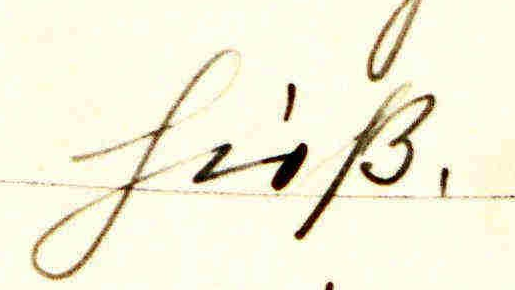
hieß.
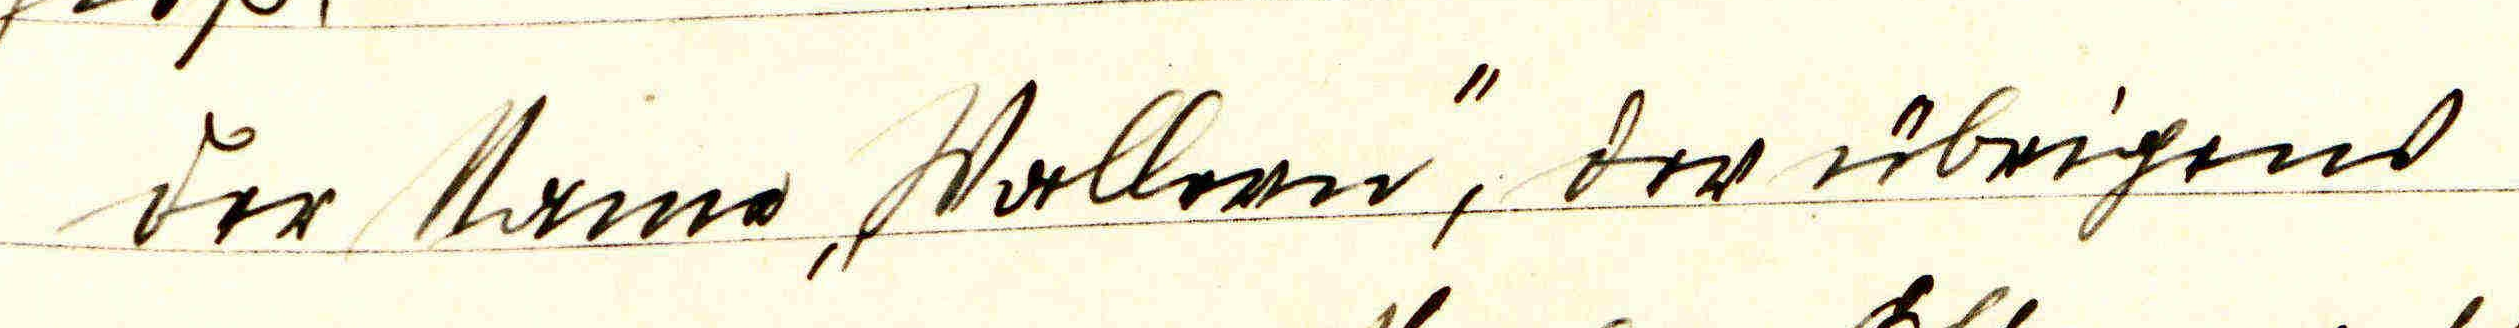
Der Name „Wallern“, der übrigens
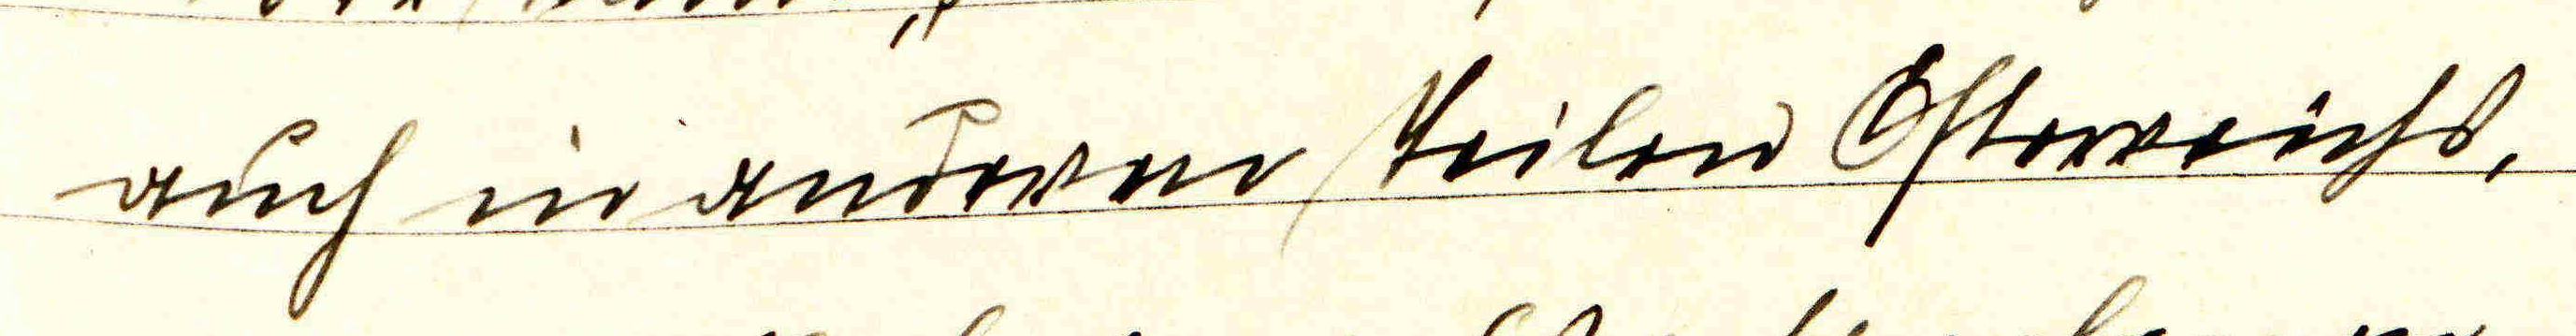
auch in anderen Teilen Österreichs,
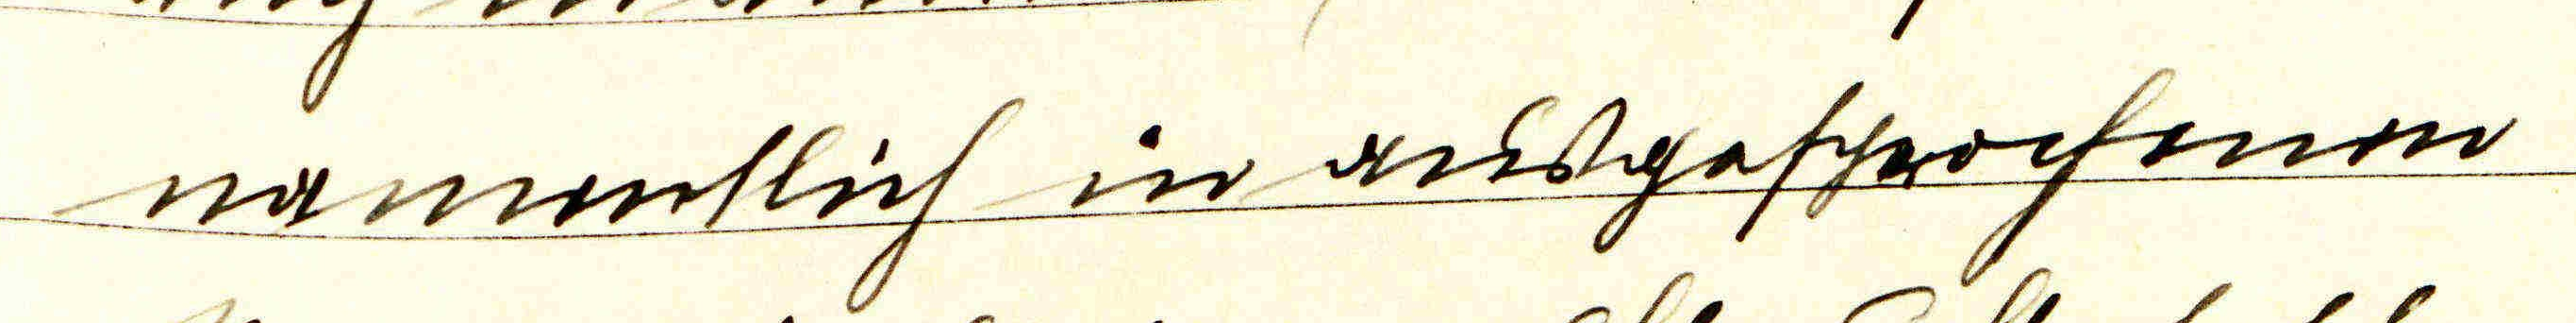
namentlich in ausgesprochenen
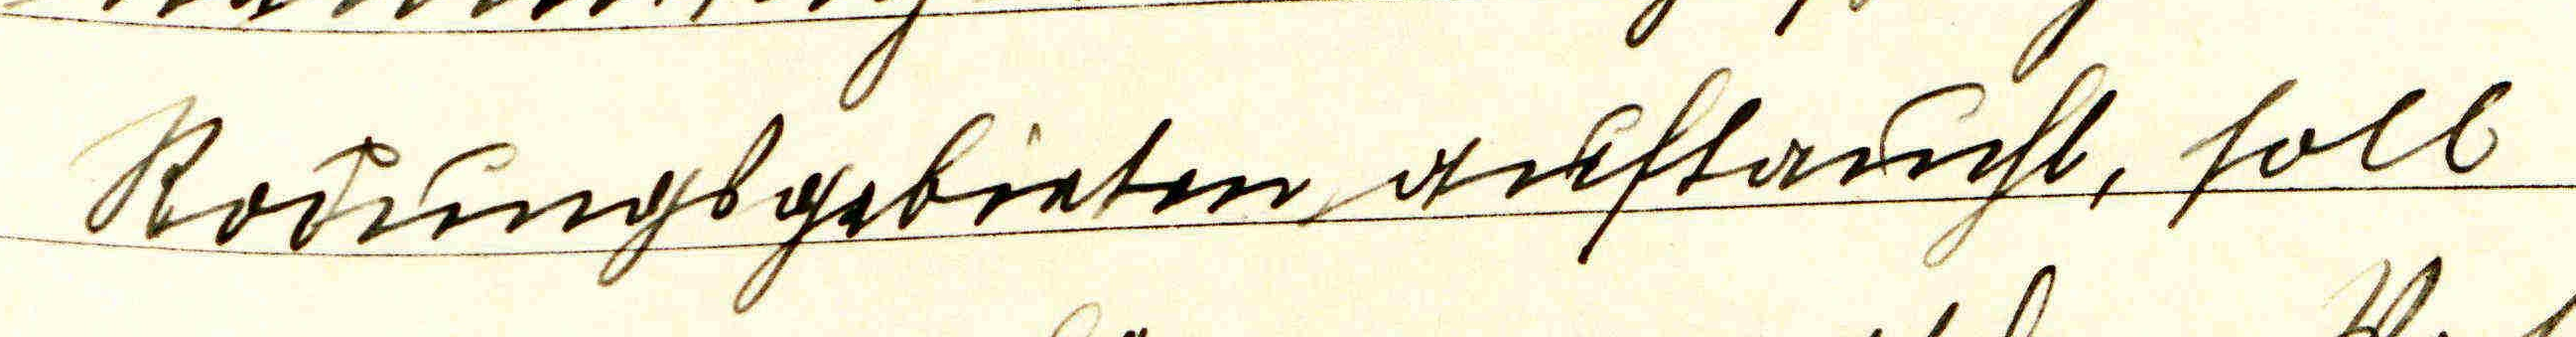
Rodungsgebieten auftaucht, soll
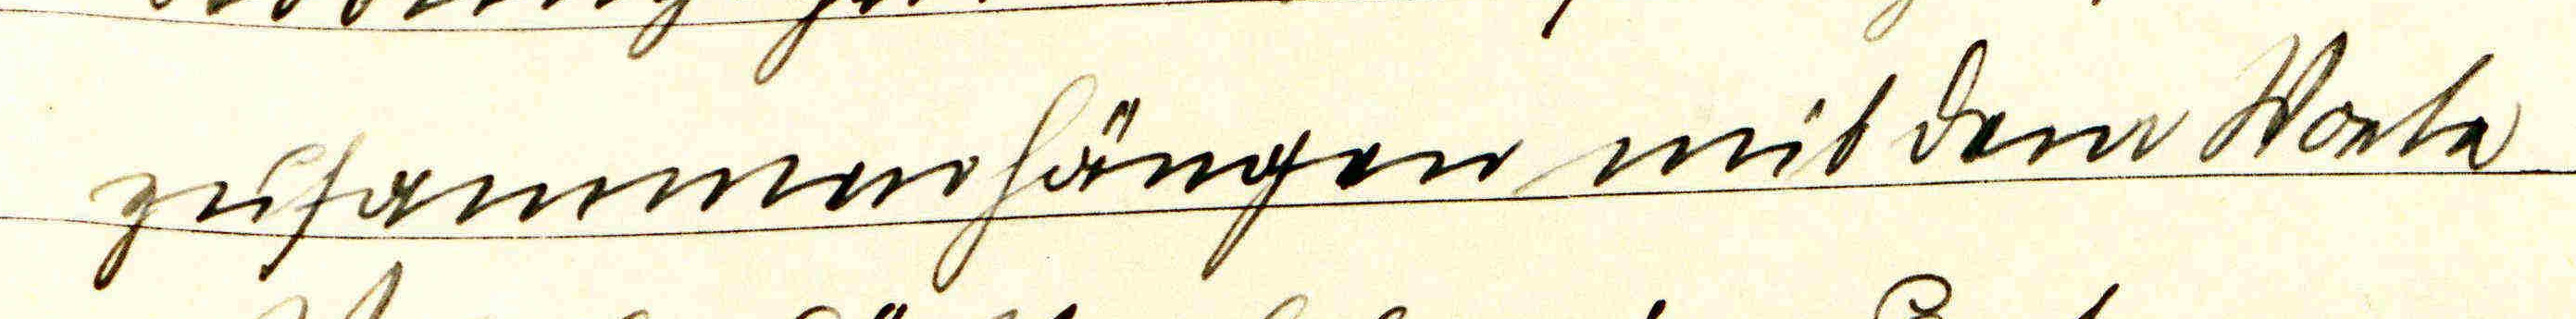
zusammenhängen mit dem Worte
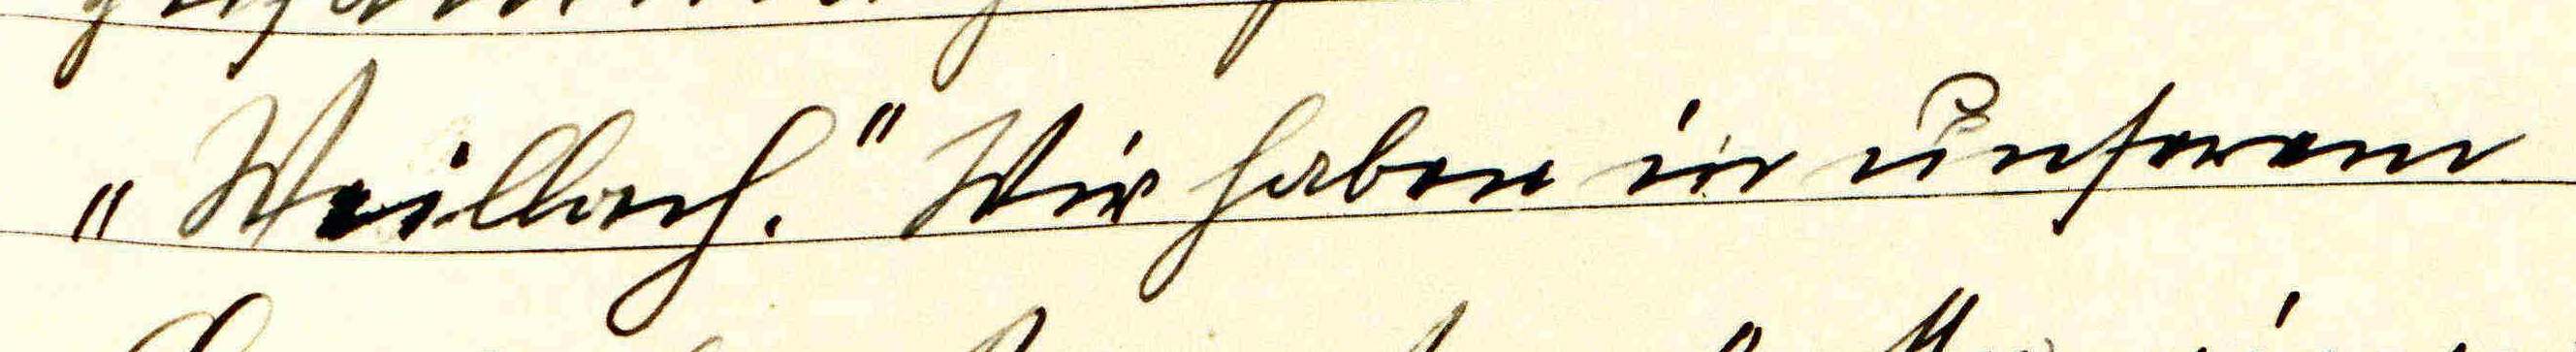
„Weillach“, Wir haben in unserem
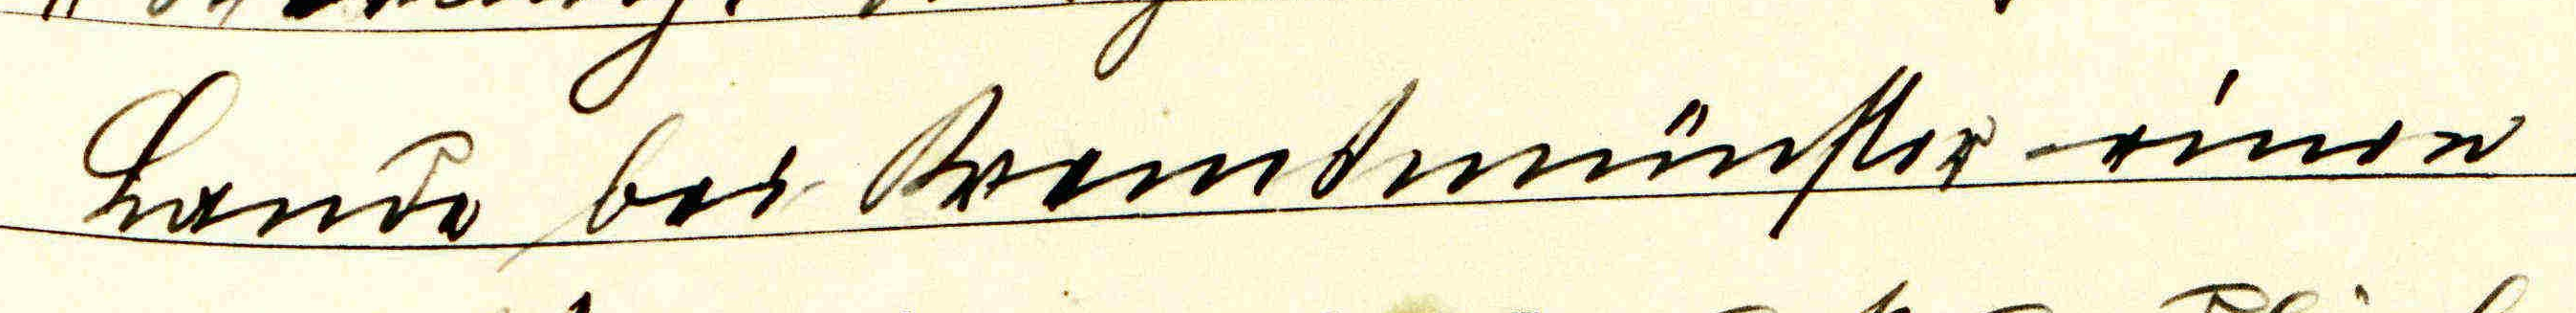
Lande bei Kremsmünster einen
